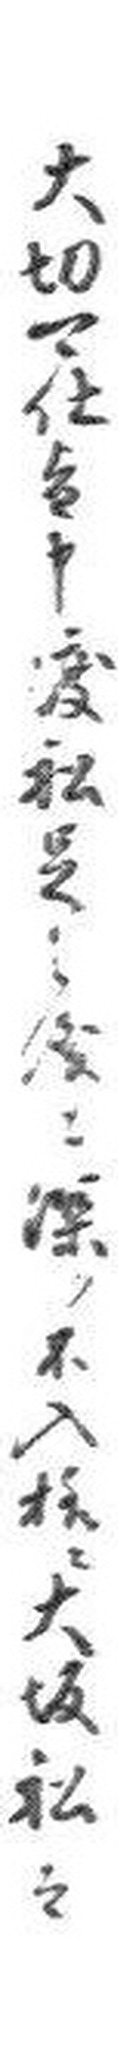大切可仕旨申渡船足之儀ニ深ク不入様ニ大坂船は
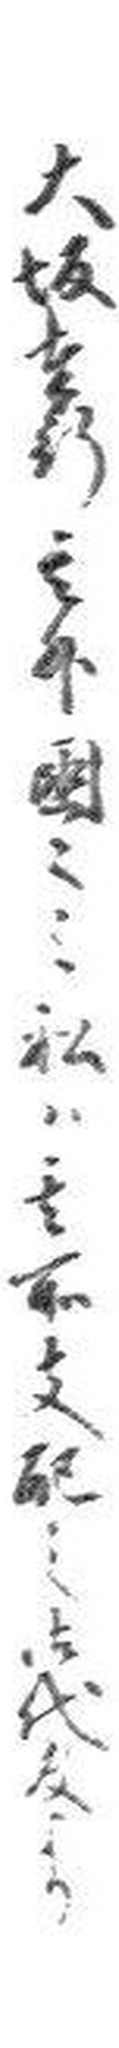大坂奉行其外国々之船ハ其所支配之御代官より
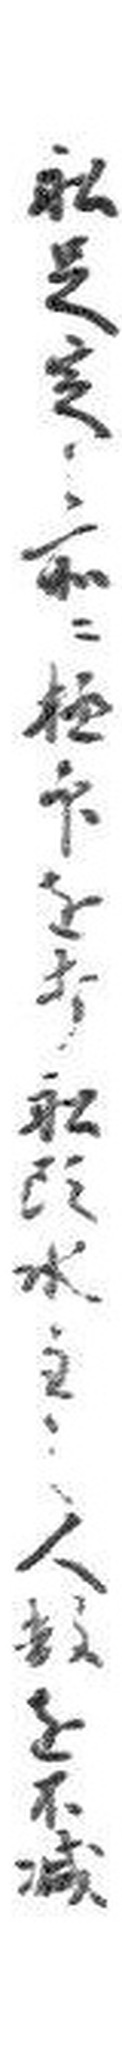船足定之所ニ極印を打船頭水主之人数を不減
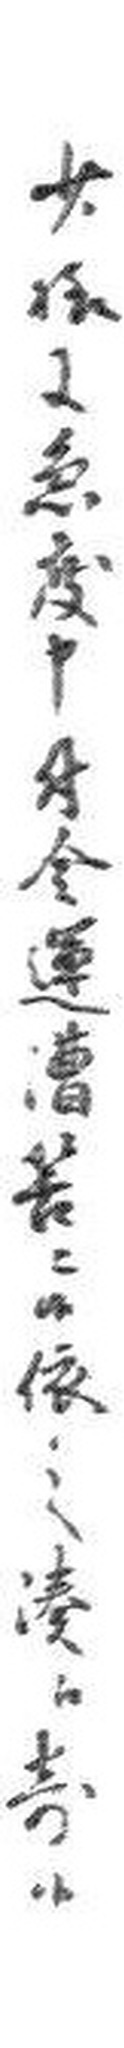少様に急度申付令運漕筈ニ候依之湊江寄候
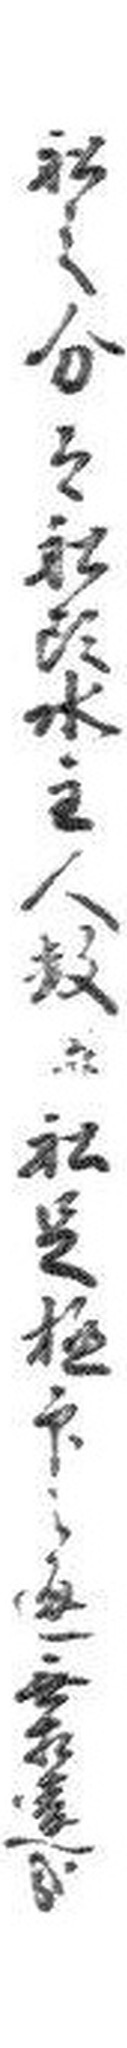船之分は船頭水主人数幷船足極印之通無相違哉
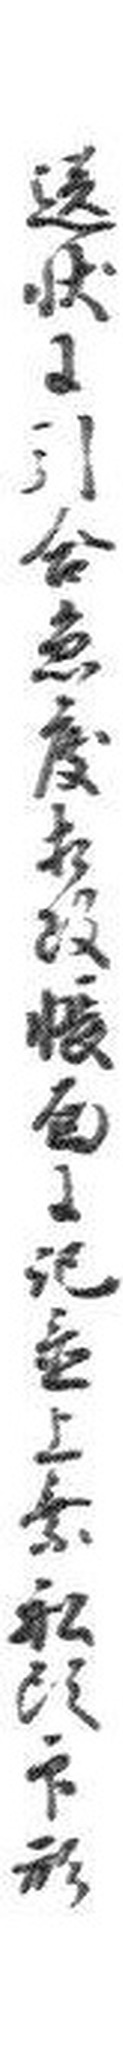送状に引合急度相改帳面に記置上乗船頭印形
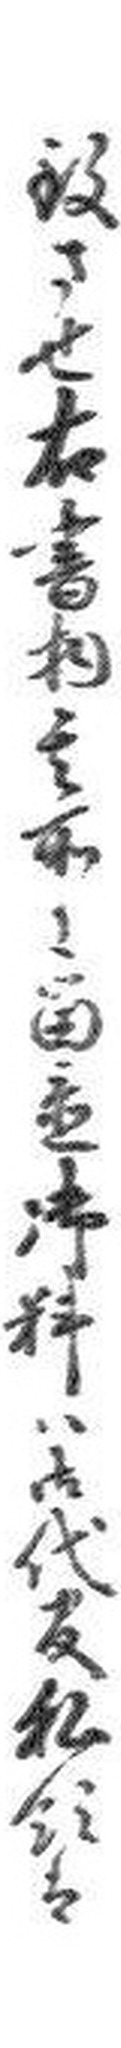致させ右書物其前に留置御料ハ御代官私領は

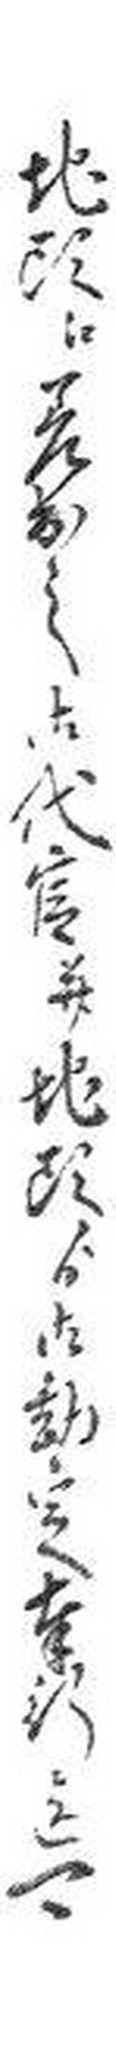地頭江差出之御代官并地頭ゟ御勘定奉行迄可
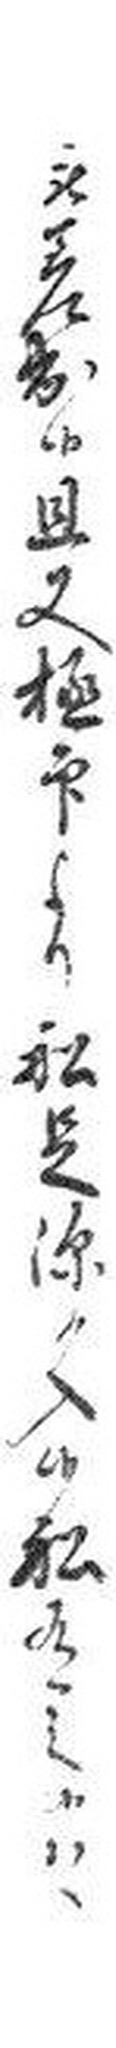被差出候且又極印より船足深ク入候船有之候ハゝ
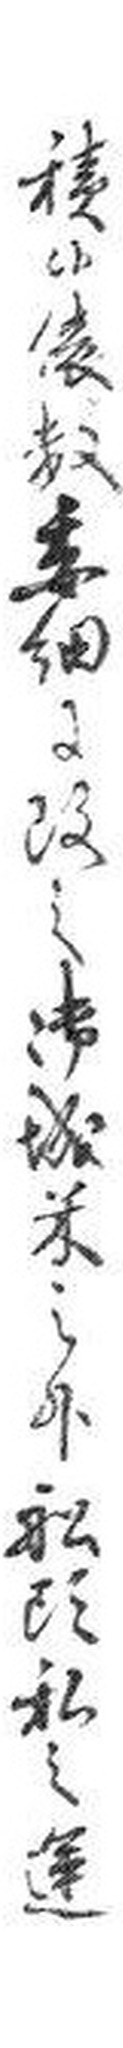積候俵数委細に改之御城米之外船頭私之運
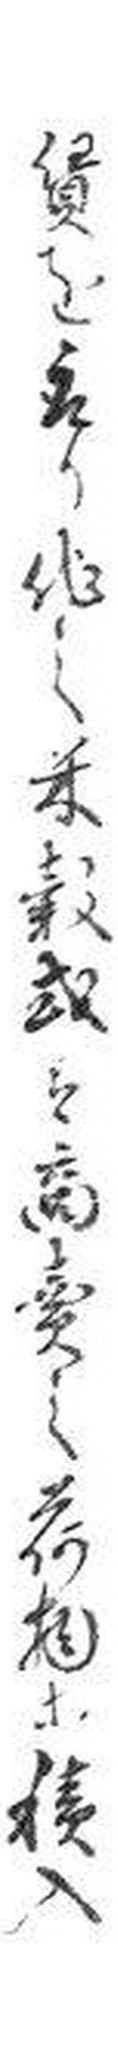賃を取り他之米穀或は商売之荷物等積入
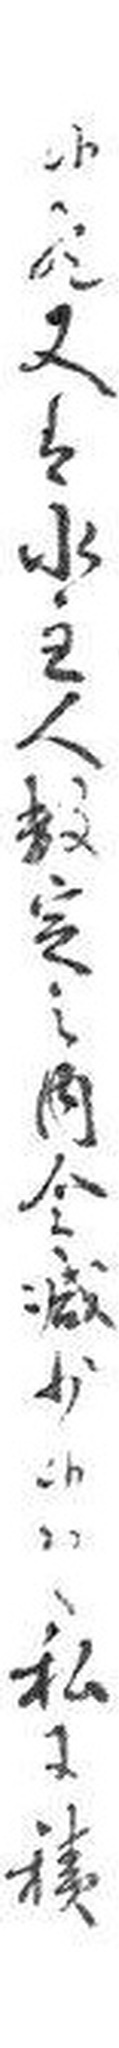候歟又は水主人数定之内令減少候ハゝ私に積
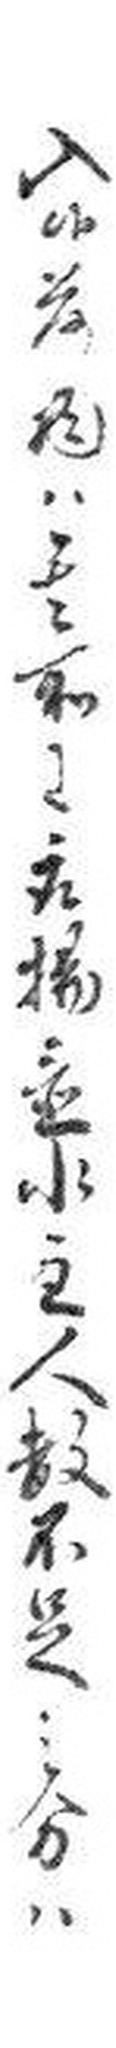入候荷物ハ其所に取揚置水主人数不足之分ハ
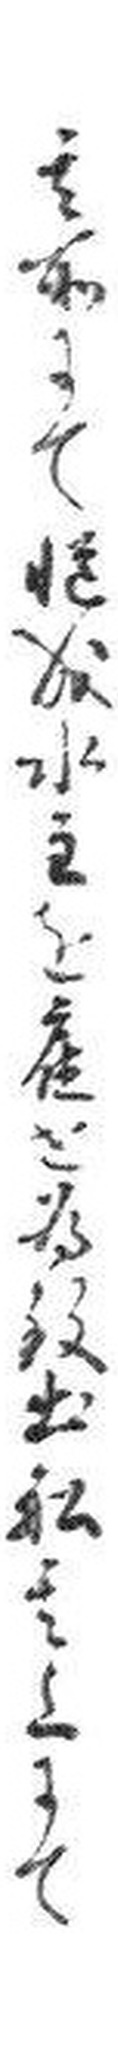其所にて慥成水主を雇せ為致出船其上にて
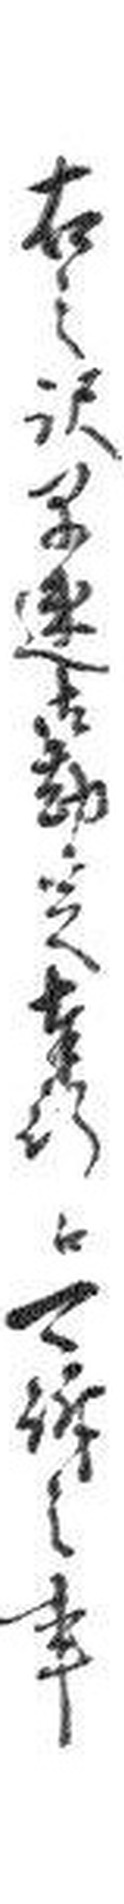右之訳早速御御勘定奉行江可訴之事
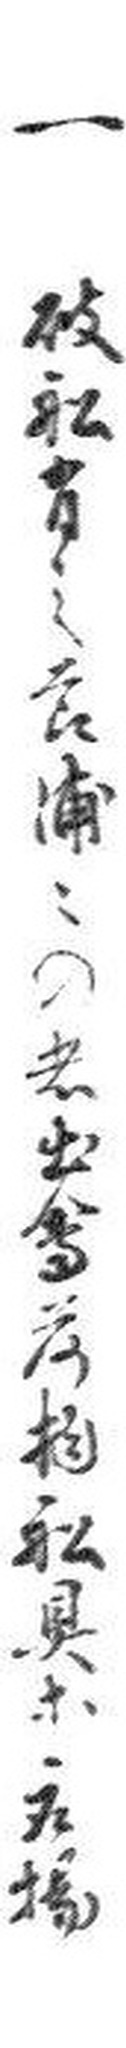一破船有之節浦々の者出会荷物船具等取揚
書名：家譜 二十九 吉邦公 従正徳二年到正徳三年
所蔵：福井県文書館 Fukui Prefectural Archives
